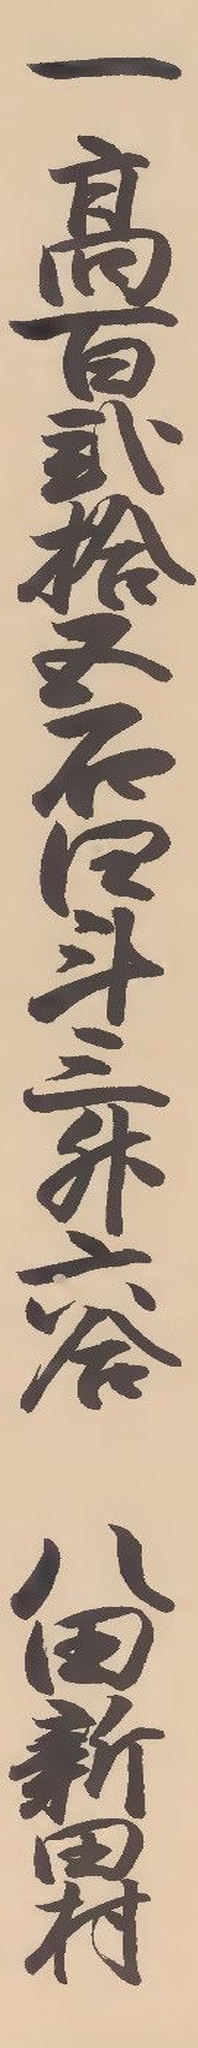一高百弐拾五石四斗三升六合八田新田村
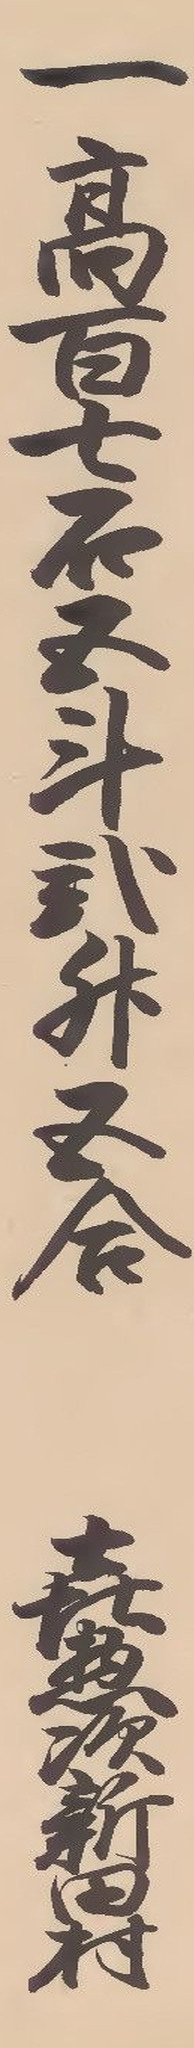一高百七石五斗弐升五合喜惣次新田村
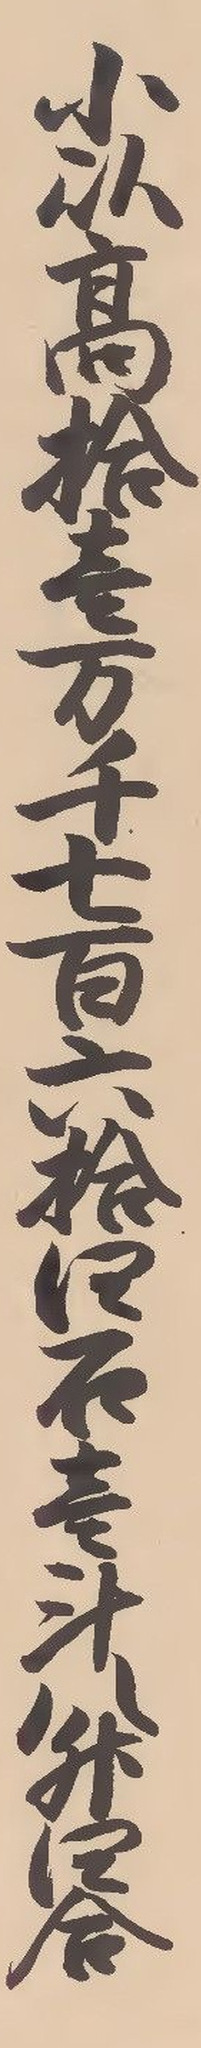小以高拾壱万千七百六拾四石壱斗八升四合
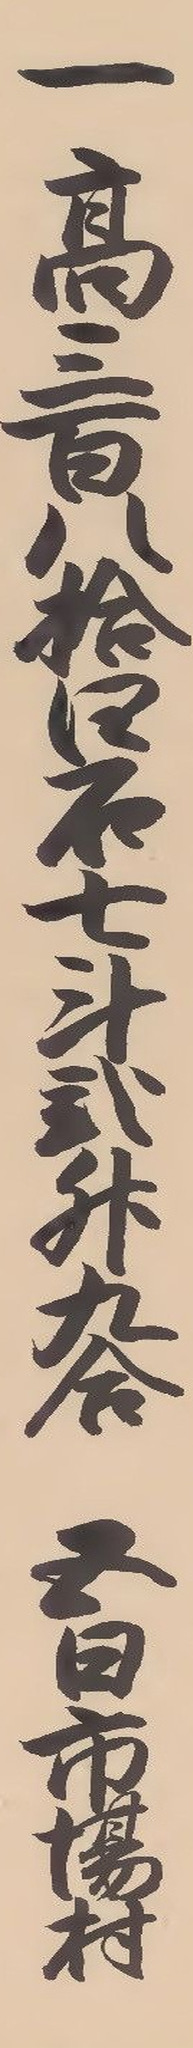一高三百八拾四石七斗弐升九合五日市場村
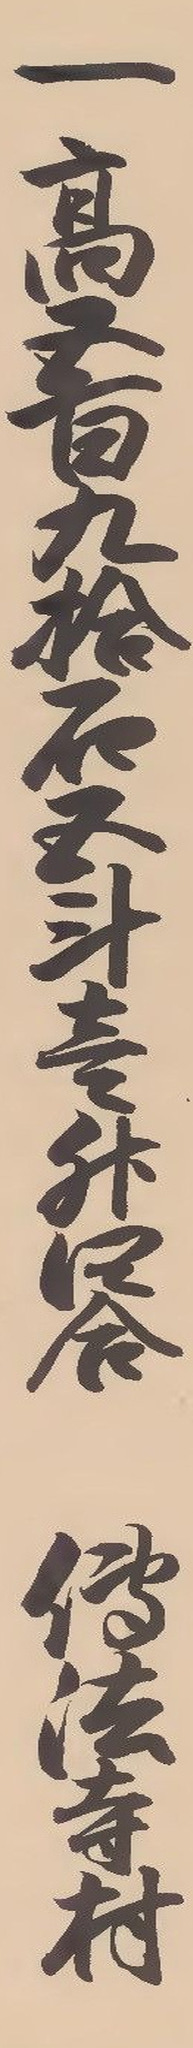一高五百九拾石五斗壱升四合伝法寺村
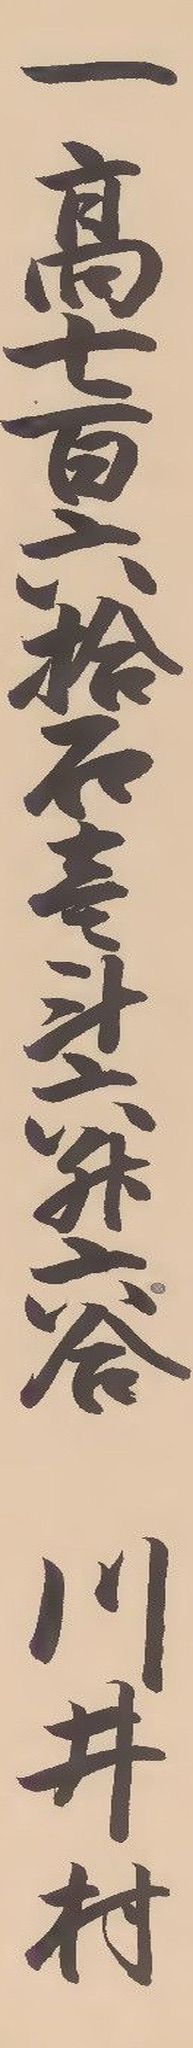一高七百六拾石壱斗六升六合川井村

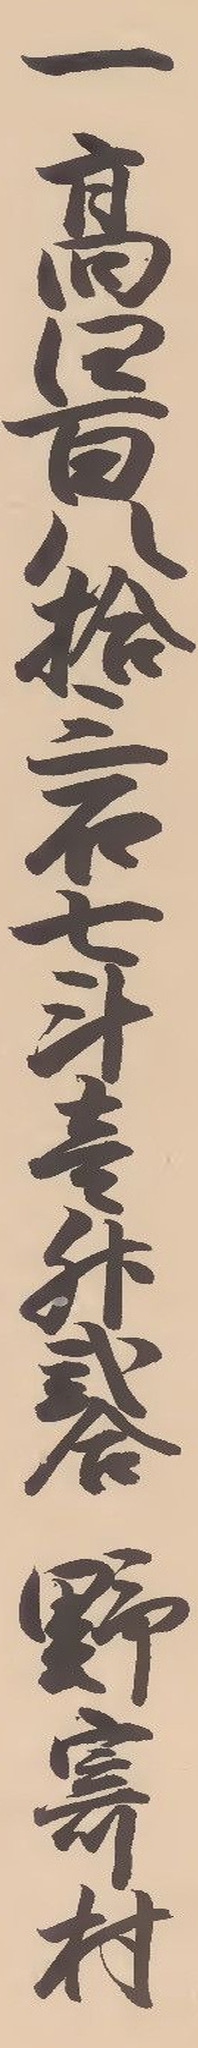一高四百八拾三石七斗壱升弐合野寄村
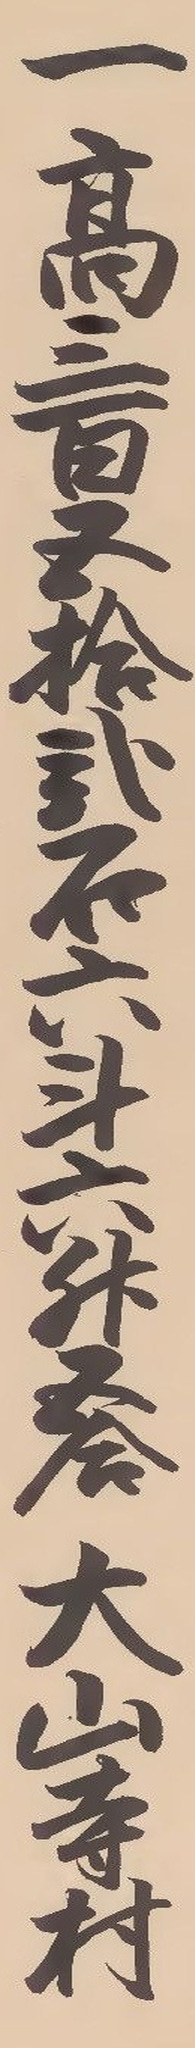一高三百五拾弐石六斗六升五合大山寺村
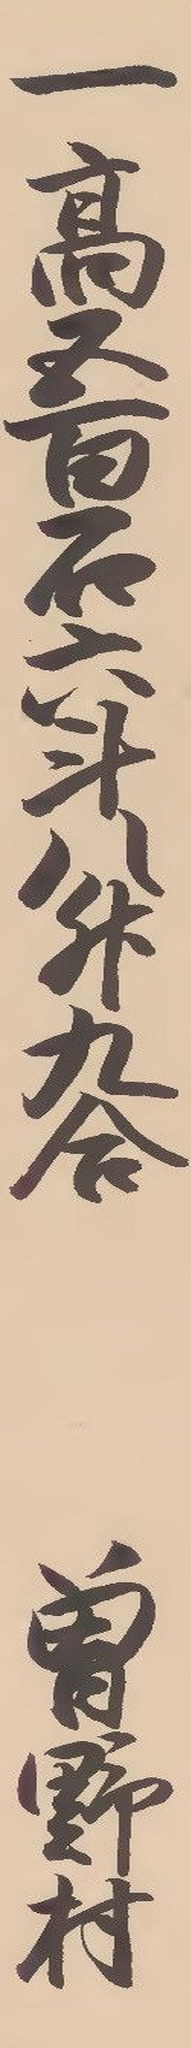一高五百石六斗八升九合曽野村
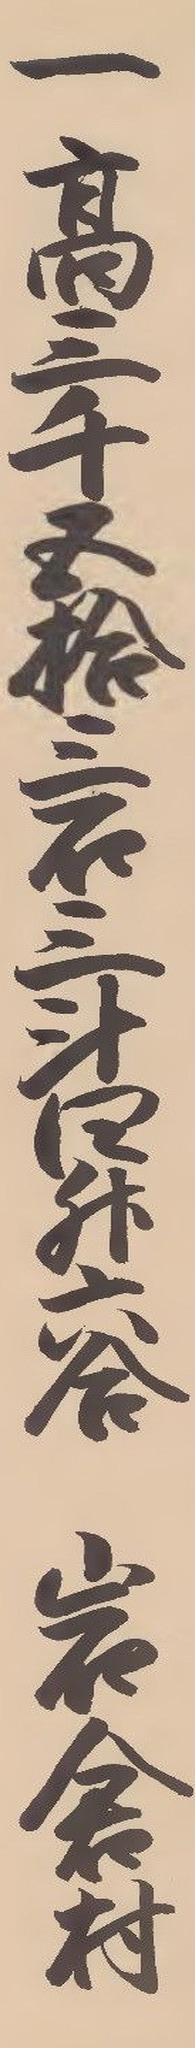一高三千五拾三石三斗四升六合岩倉村
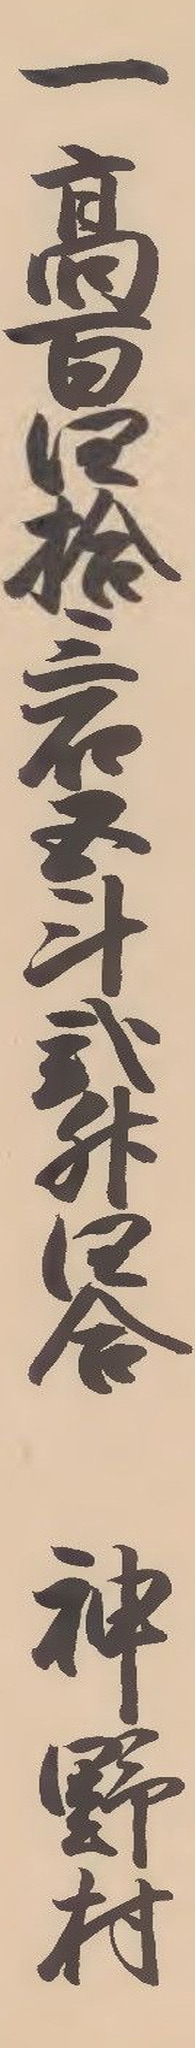一高百四拾三石五斗弐升四合神野村
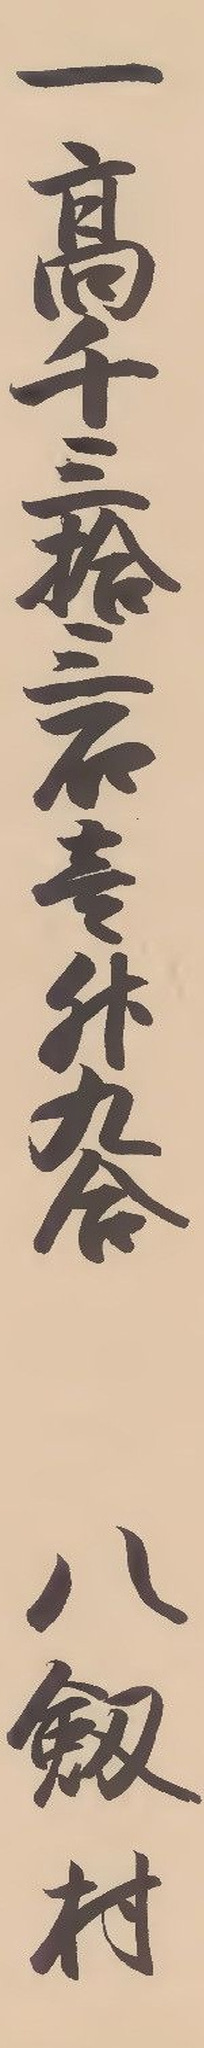一高千三拾三石壱升九合八剣村
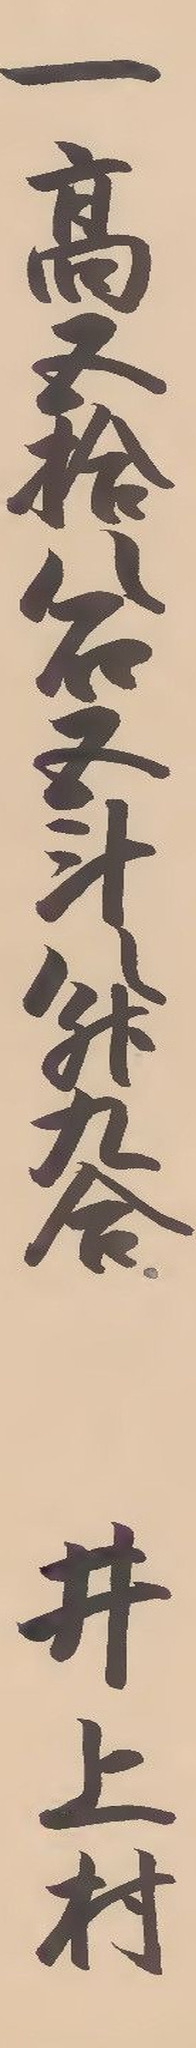一高五拾八石五斗八升九合井上村

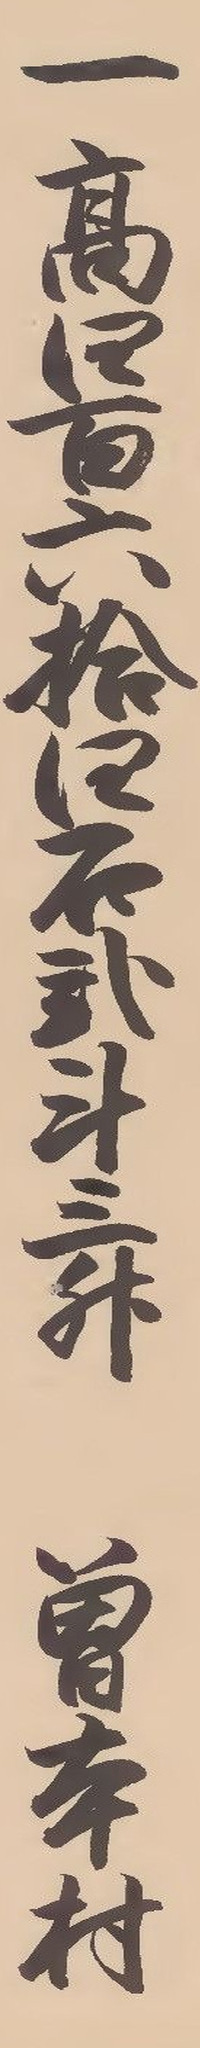一高四百六拾四石弐斗三升曽本村
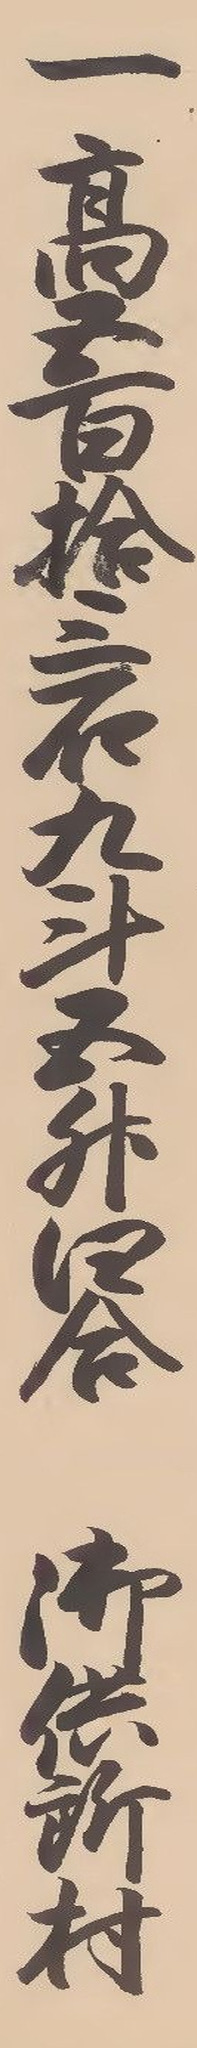一高五百拾三石九斗五升四合御供所村
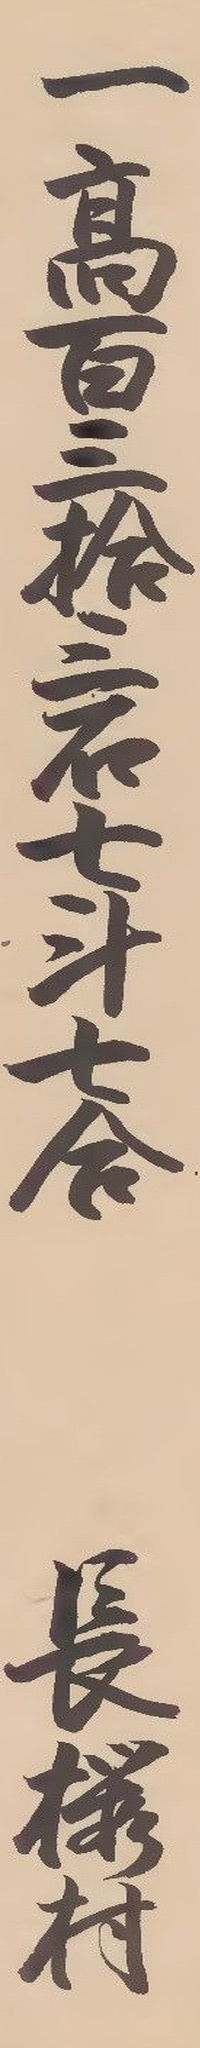一高百三拾三石七斗七合長桜村
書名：尾張国郷帳
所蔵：国立公文書館 National Archives of Japan
